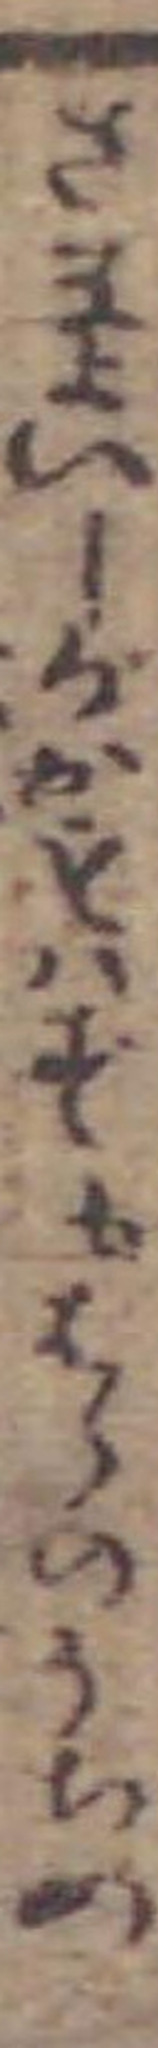さまよいしがおもはすもはらのうちの
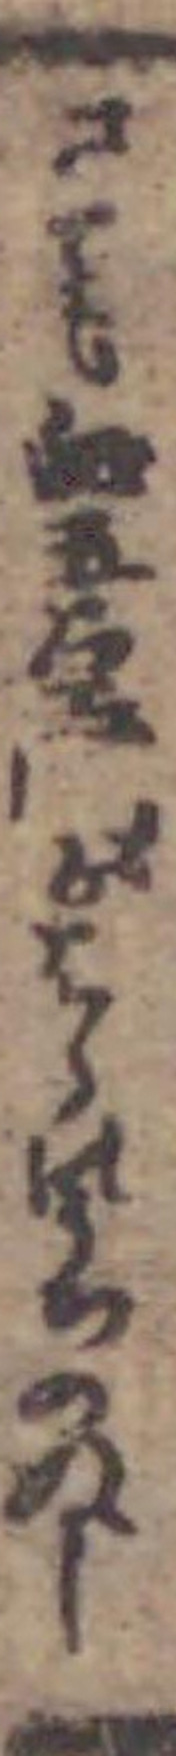さても蛇五右エ門がはらのうちのぬし
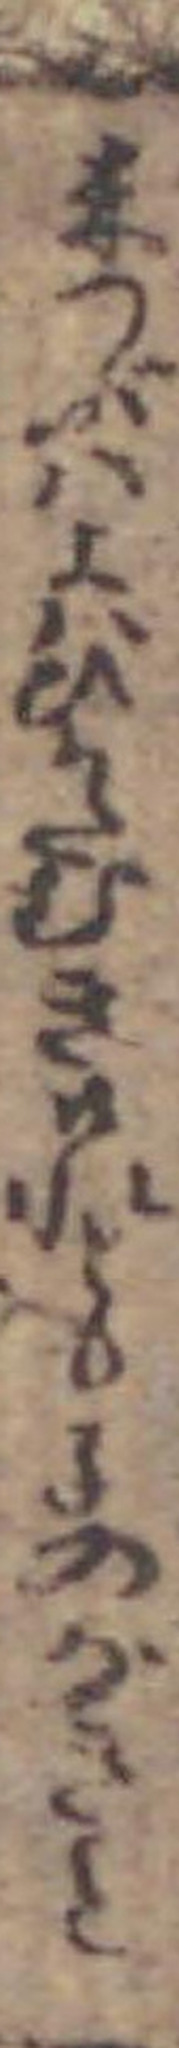米つぶはよはひかたむきけれとも子のなきこと
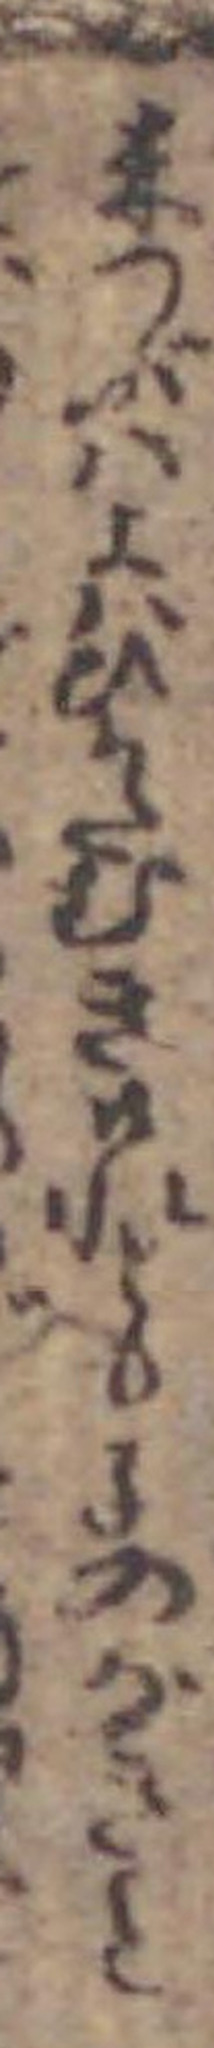米つぶはよはひかたむきけれとも子のなきこと
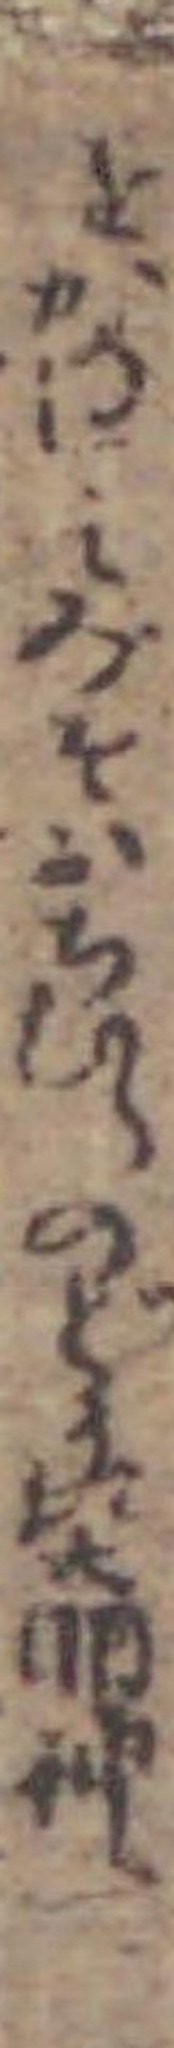をかなしみみそおちむらの大明神へ
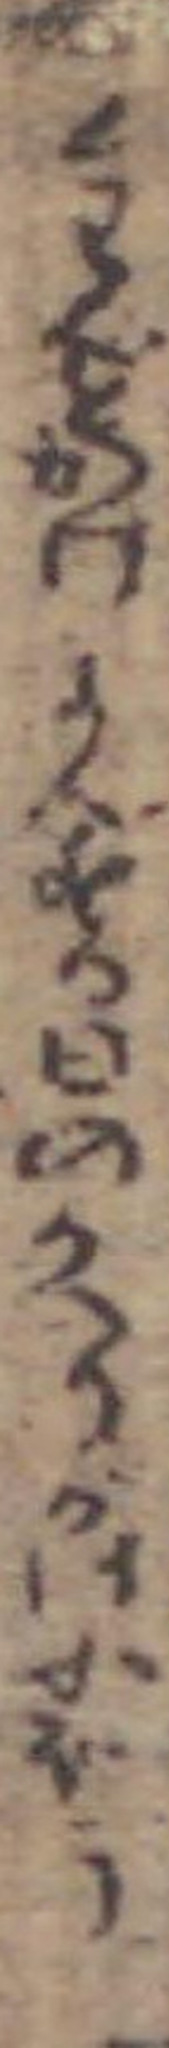くわんをかけかんする日のかへりがけにほう
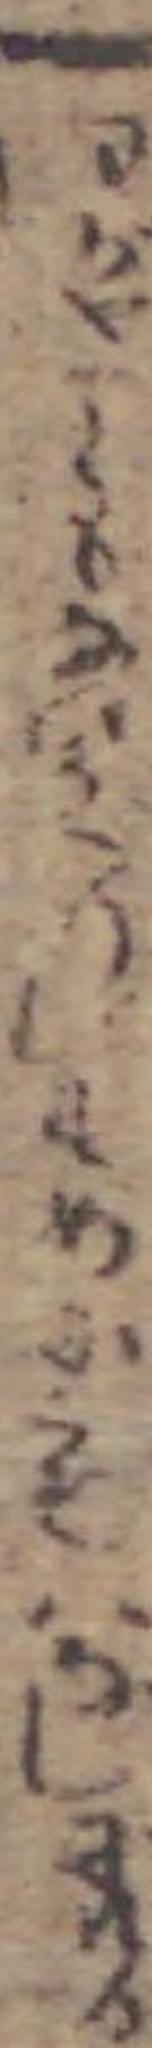わがやへともないかへりむすめにこはなしにける
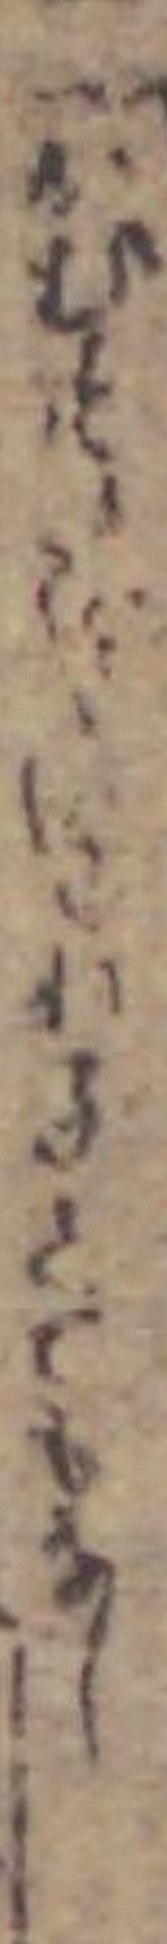〽ほおむとゝひすいわれ子とてもなし
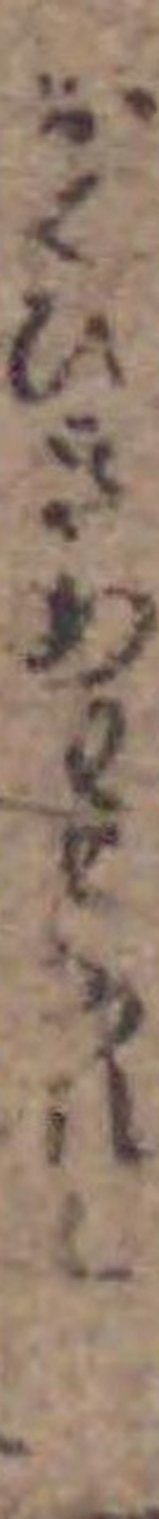おんひきあわせなれは
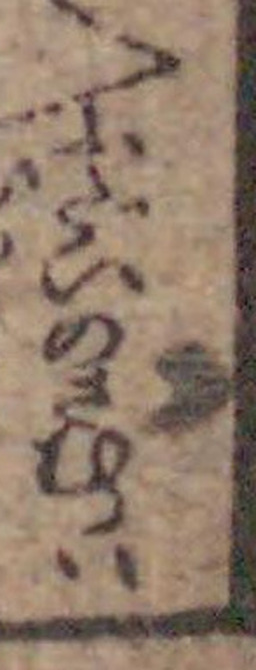ふだいのさむらい
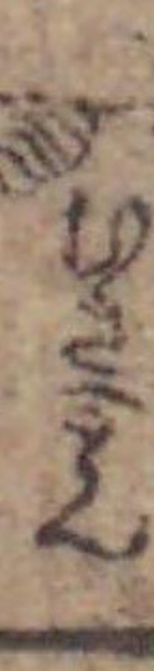むさへもん
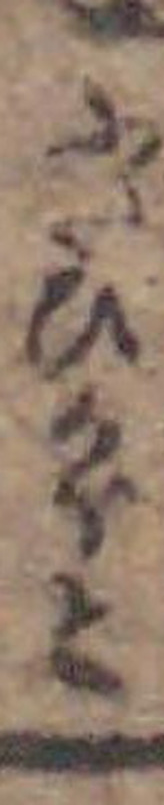ふたひかほと
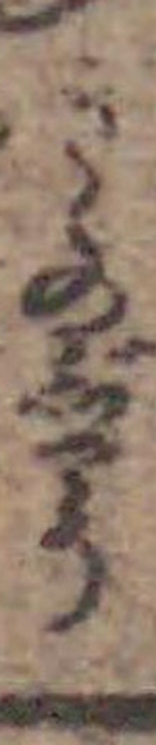きくのじやう
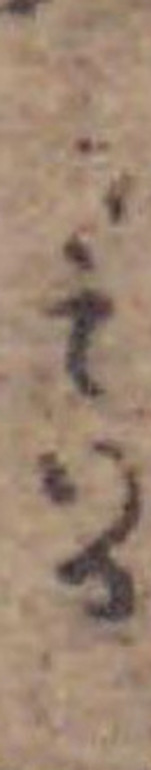きている
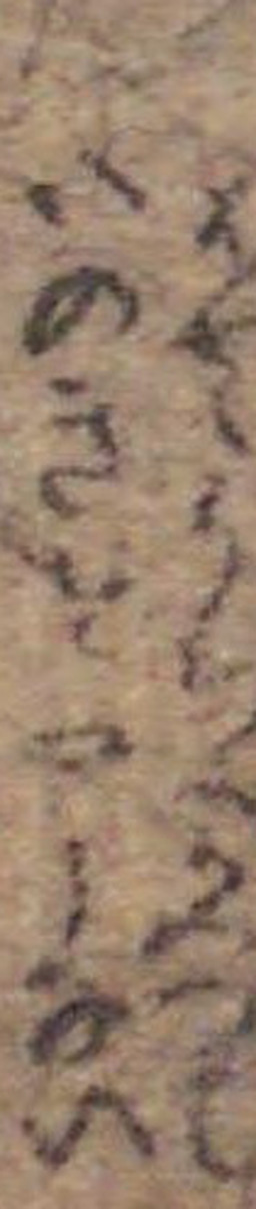いのきをやしない

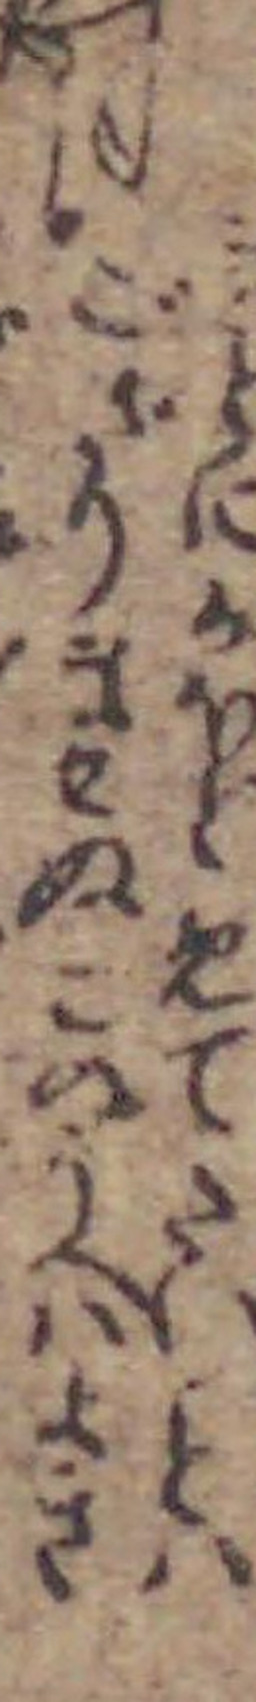ござりませぬこのうへはよき
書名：腹京師食物合戦 : 2巻
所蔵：国立国会図書館 National Diet Library, JAPAN
